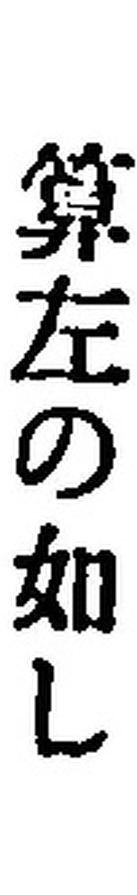算左の如し
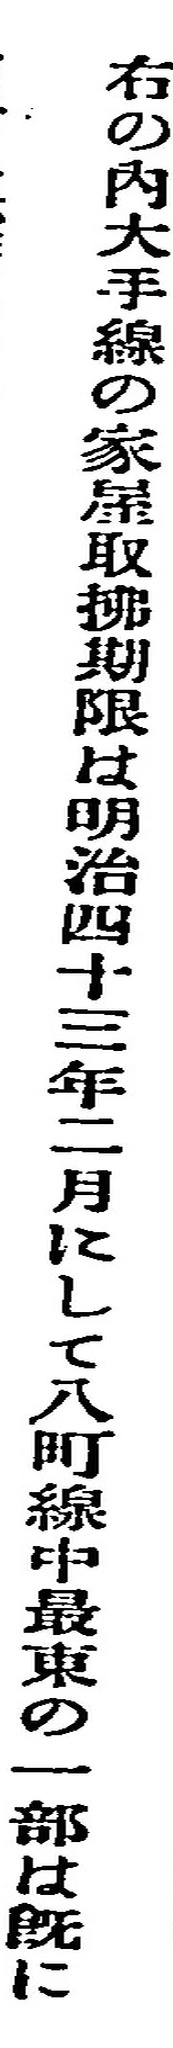右の内大手線の家屋取拂期限は明治四十三年二月にして八町線中最東の一部は旣に
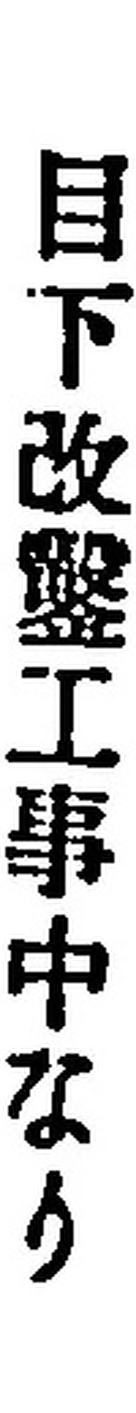目下開鑿工事中なり
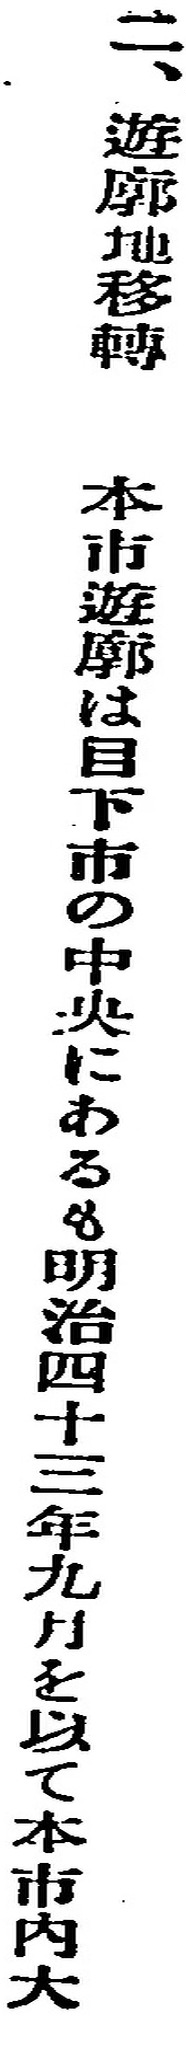二、遊廓地移轉本市遊廓は目下市の中央にあるも明治四十三年九月を以て本市内大
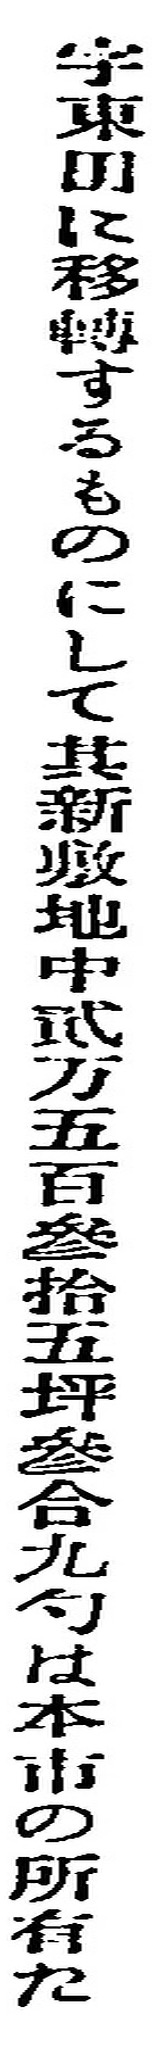字東田に移轉するものにして其新敷地中貳万五百參拾五坪參合九勺は本市の所有た
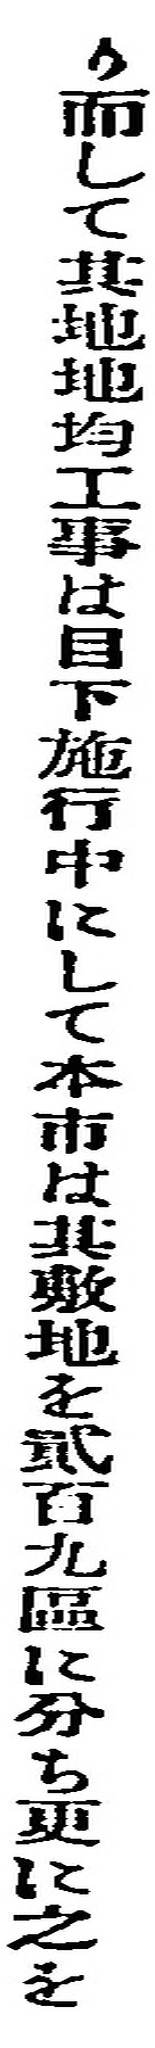り而して其地地均工事は目下施工中にして本市は其敷地を貳百九區に分ち更に之を
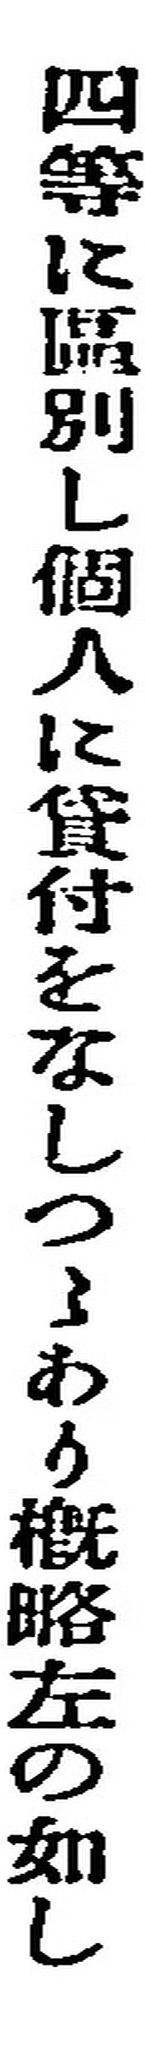四等に區別し個人に貸付をなしつゝあり槪略左に如し
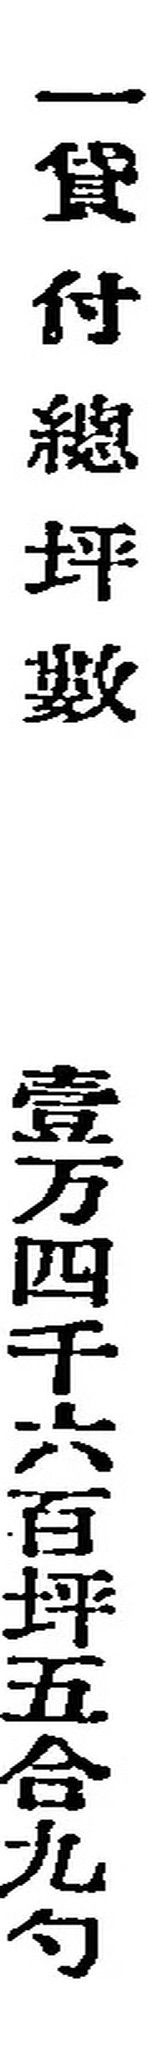一貸付總坪數壹万四千六百坪五合九勺
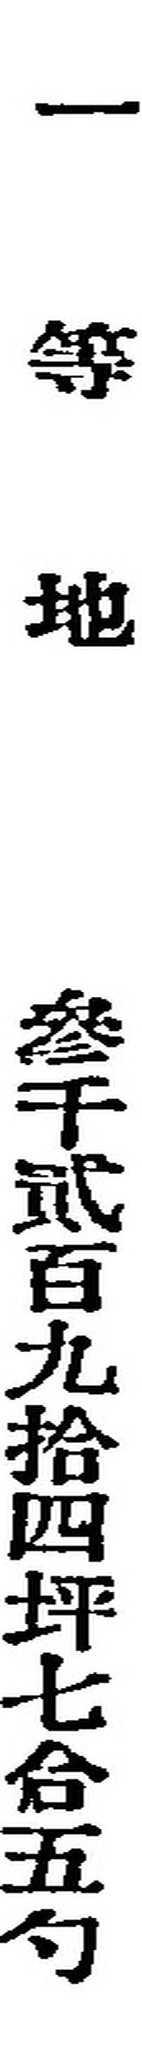一等地參千貳百九拾四坪七合五勺
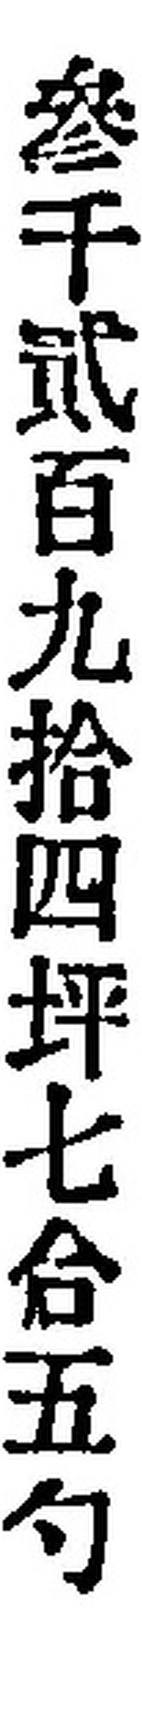一等地參千貳百九拾四坪七合五勺
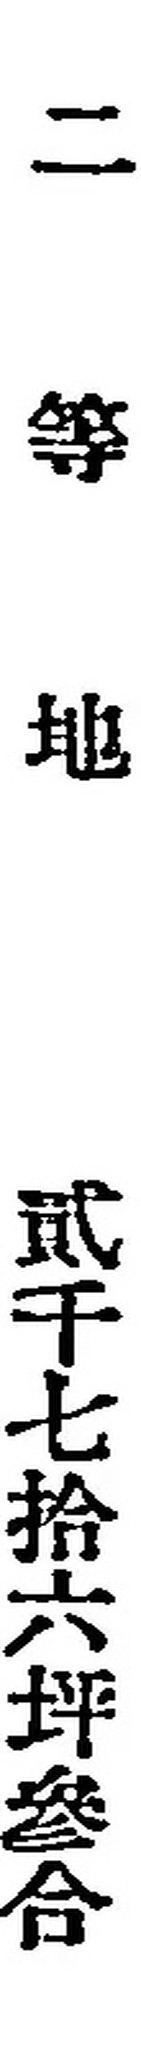二等地貳千七拾六坪參合
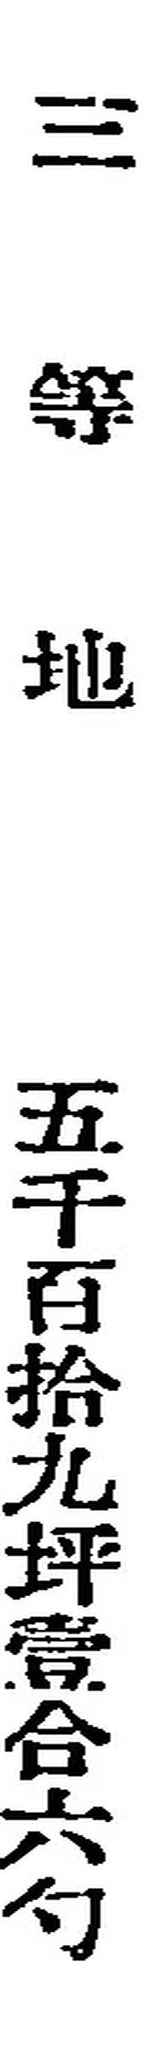三等地五千百拾九坪壹合六勺
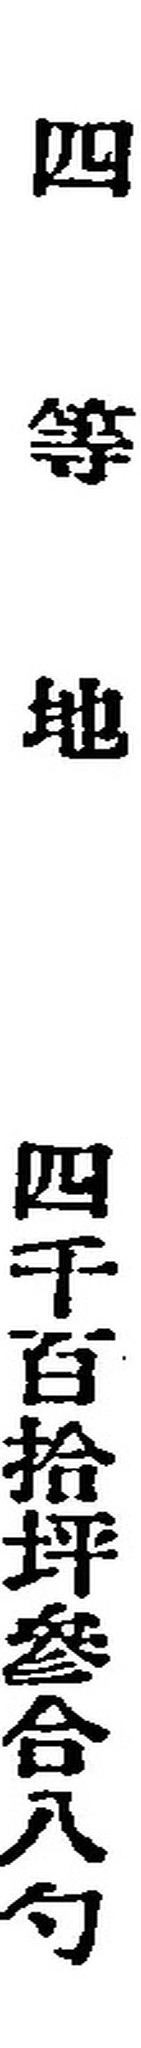四等地四千百拾坪參合八勺
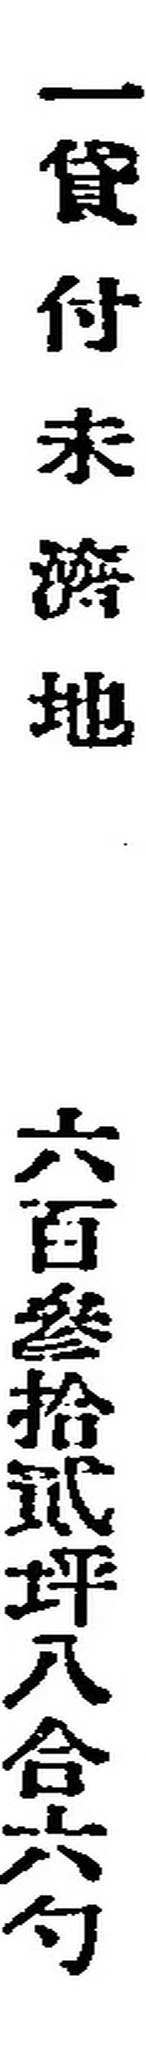一貸付未濟地六百参拾貳坪八合六勺
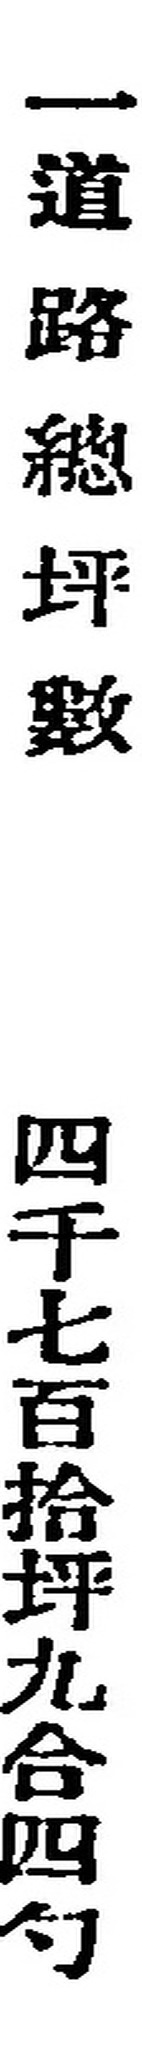一道路總坪數四千七百拾坪九合四勺
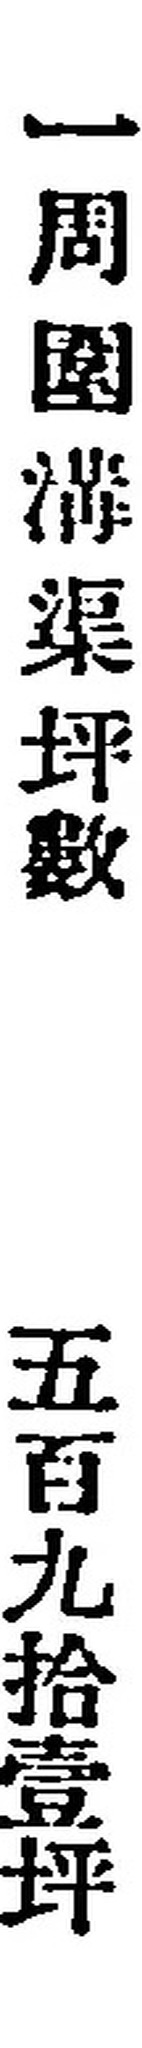一周圍溝渠坪數五百九拾壹坪
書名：豊橋志要
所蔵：国立国会図書館 National Diet Library, JAPAN
